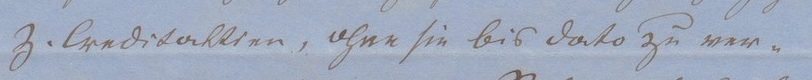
Z. Creditaktien, ohne sie bis dato zu ver-
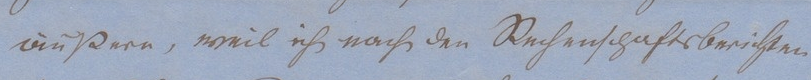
äußern, weil ich nach den Rechenschaftsberichten
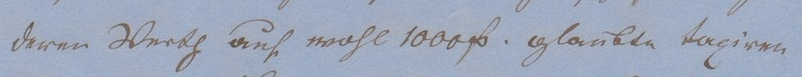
deren Werth auf wohl 1000fs. glaubte taxiren
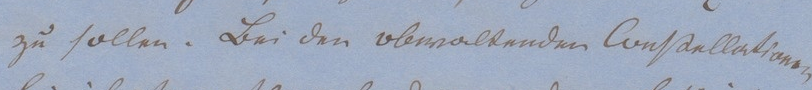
zu sollen. Bei den obwaltenden Constellationen
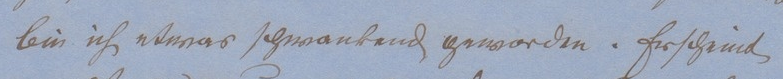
bin ich etwas schwankend geworden. Erscheint
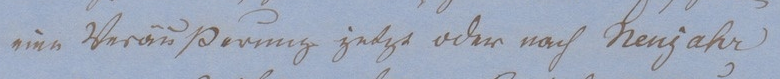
eine Veräußerung jetzt oder nach Neujahr
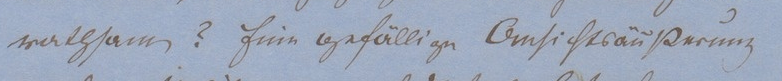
rathsam? Eine gefällige Ansichtsäußerung
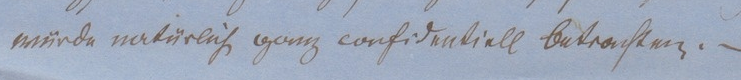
würde natürlich ganz confidentiell betrachten. –
